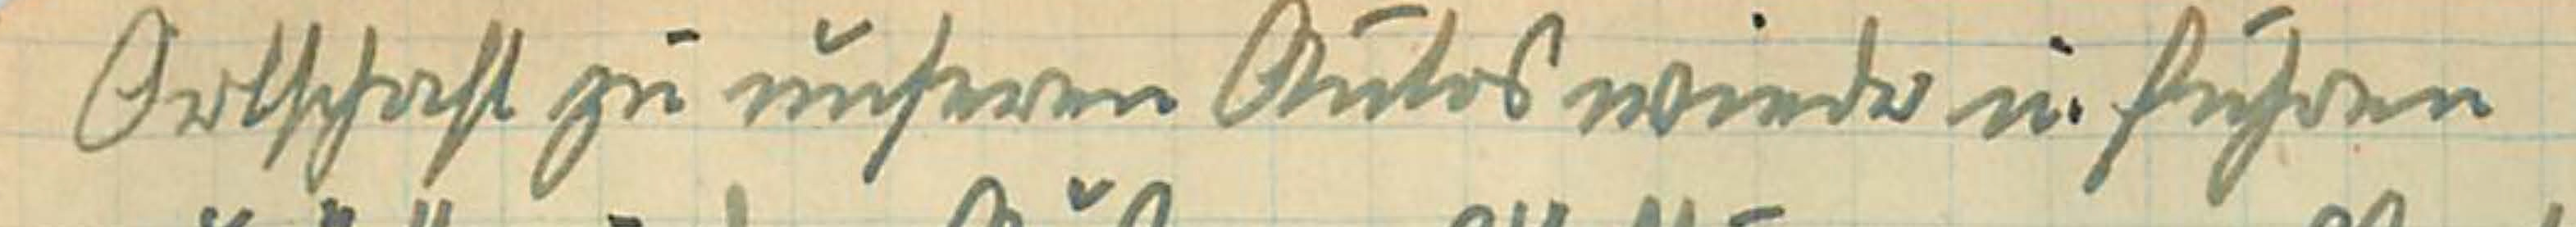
Ortschaft zu unseren Autos wieder u. fuhren
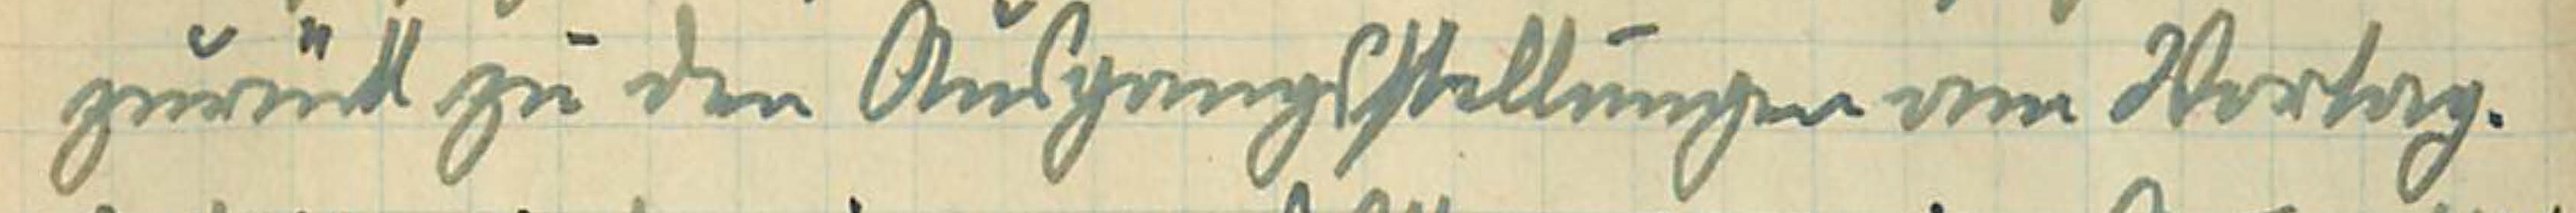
zurück zu den Ausgangsstellungen am Vortag.
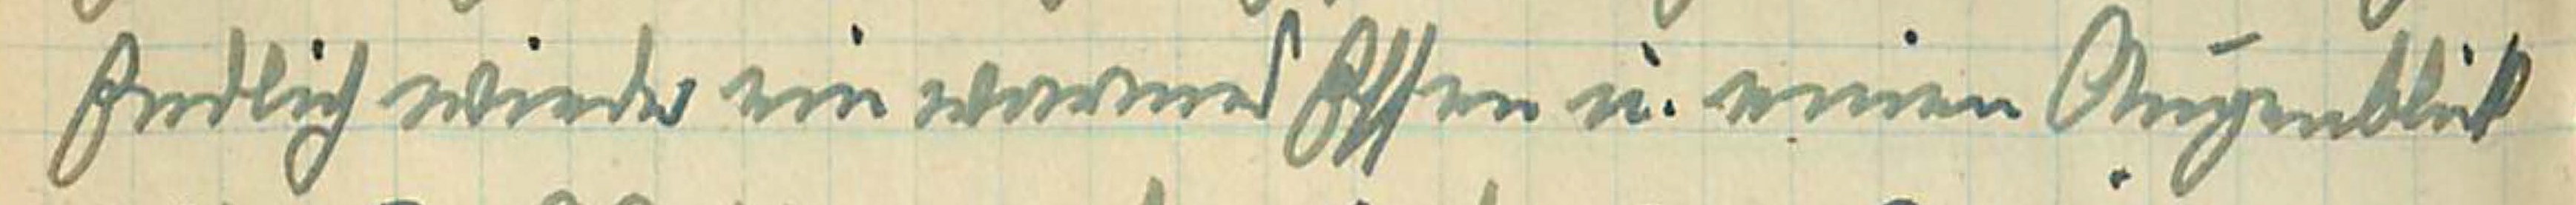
Endlich wieder ein warmes Essen u. einen Augenblick
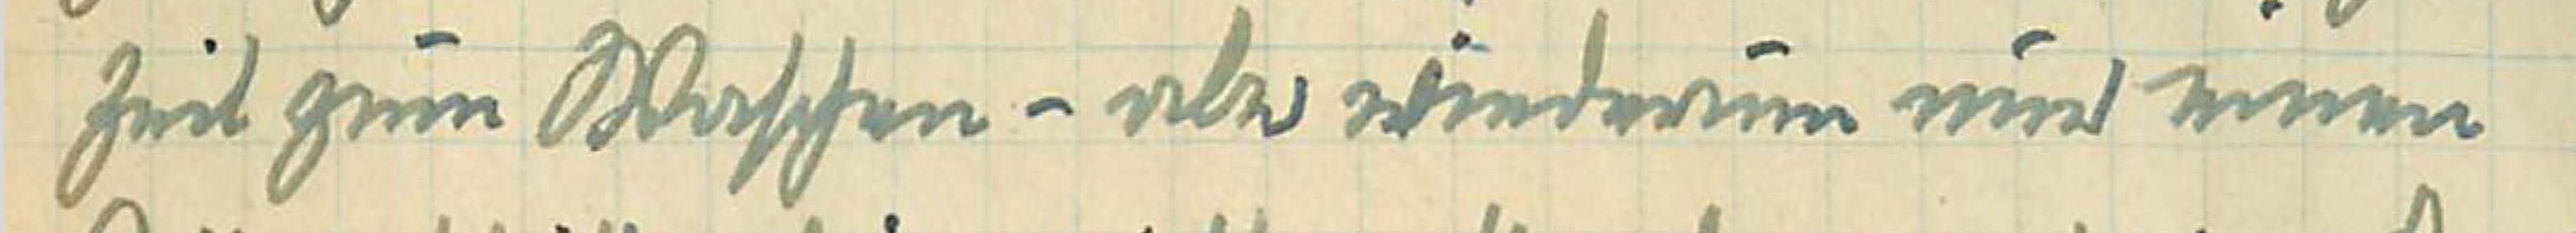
Zeit zum Waschen – aber wiederum nur einen
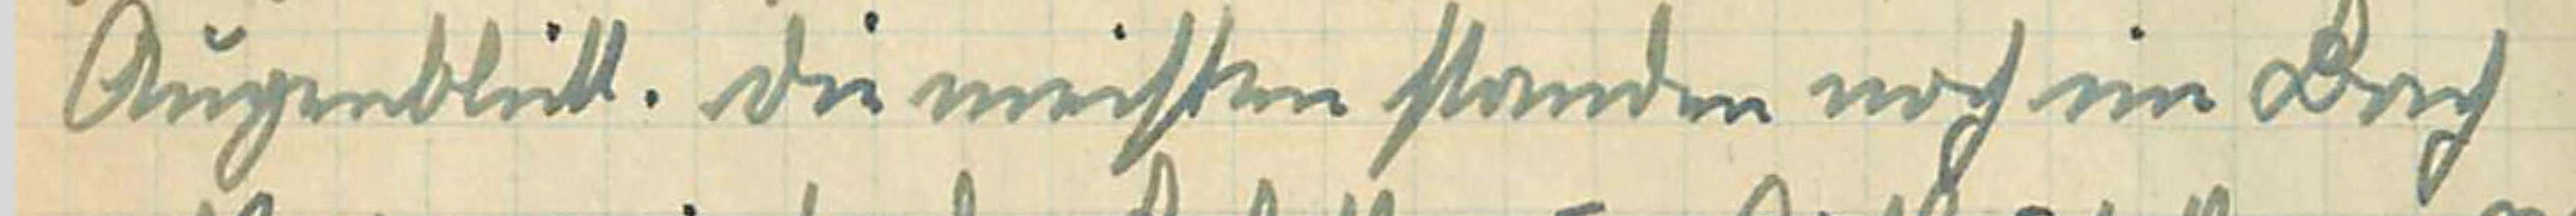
Augenblick. Die meisten standen noch im Bach
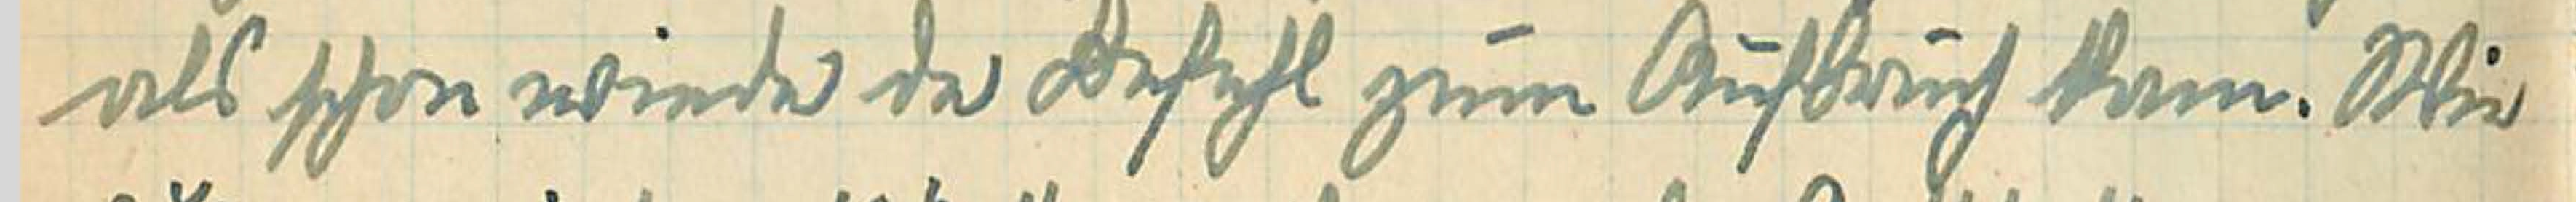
als schon wieder der Befehl zum Aufbruch kam. Wir
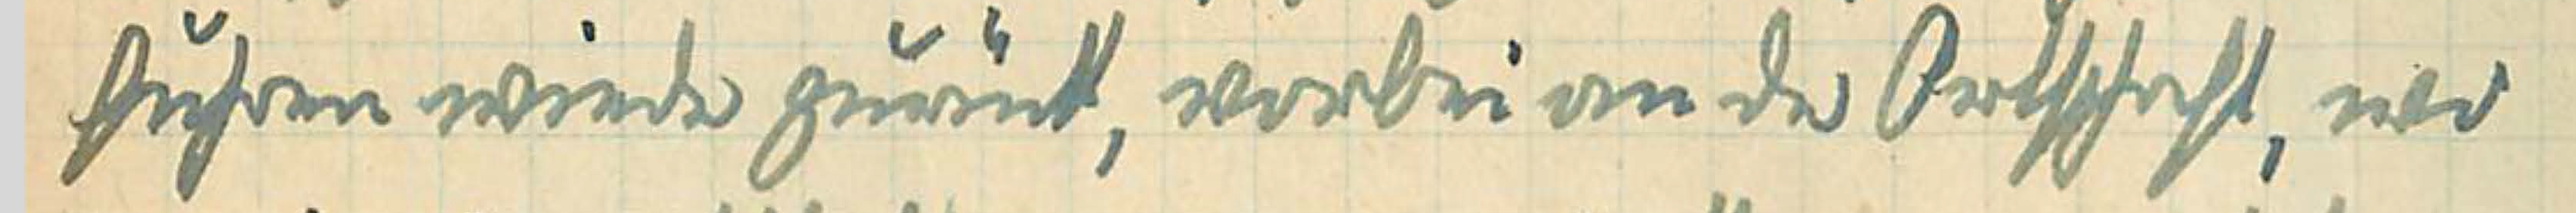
fuhren wieder zurück, vorbei an der Ortschaft, wo
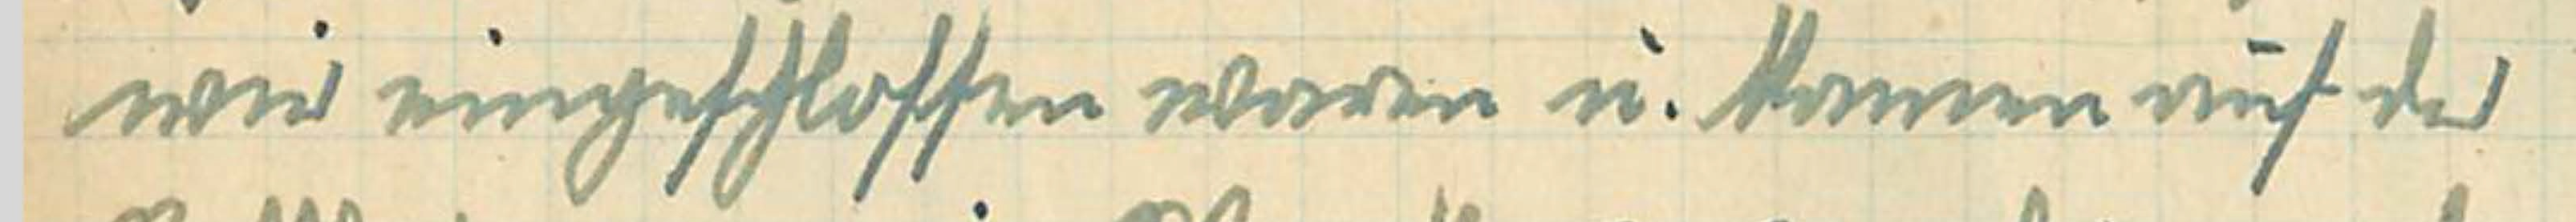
wir eingeschlossen waren u. kamen auf der
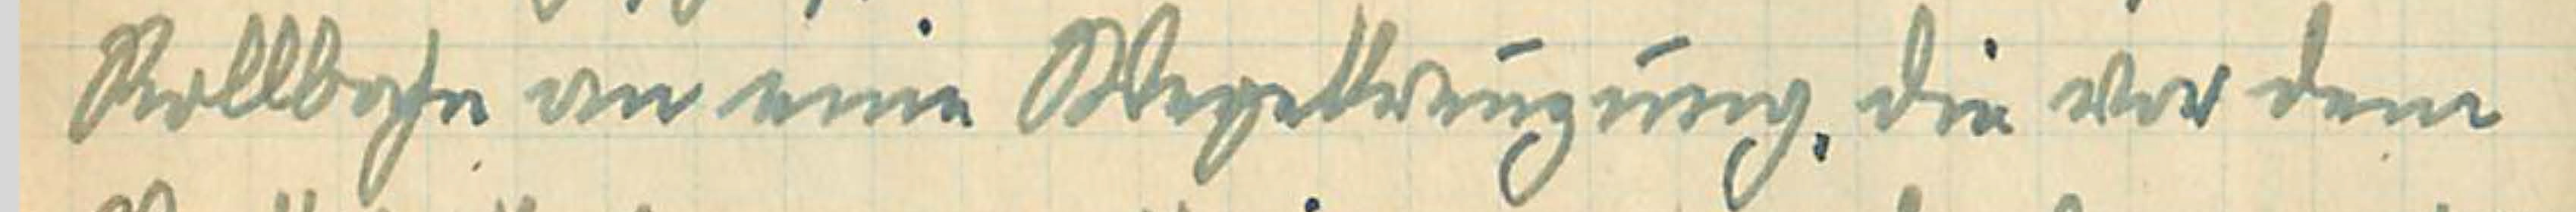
Rollbahn an eine Wegekreuzung, die vor dem
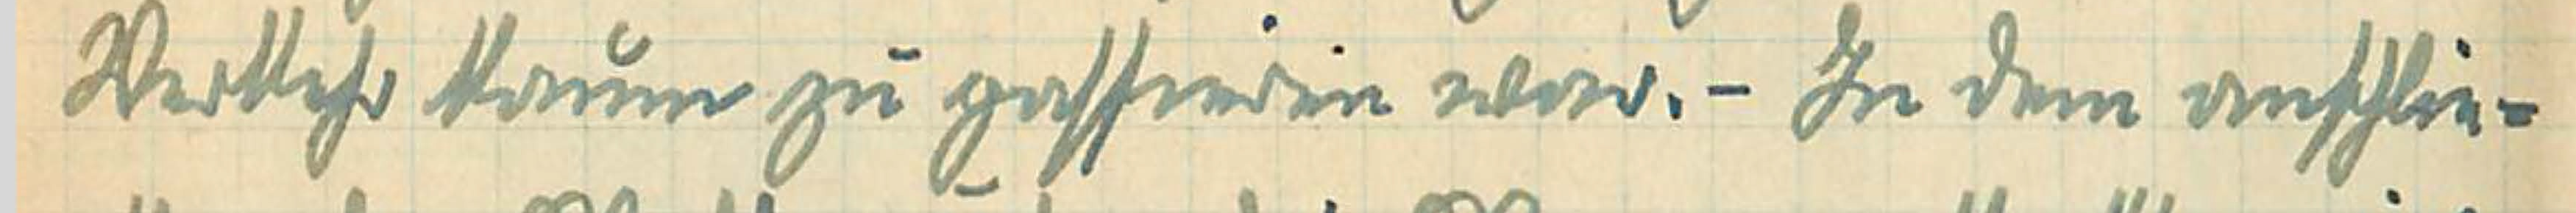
Verkehr kaum zu passieren war. – In dem anschlie-
